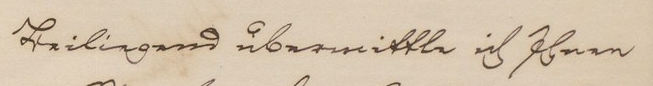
Beiliegend übermittle ich Ihnen
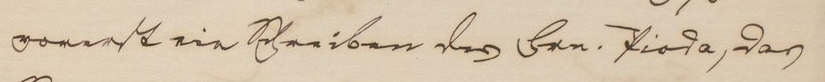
vorerst ein Schreiben des Hrn. Pioda, das
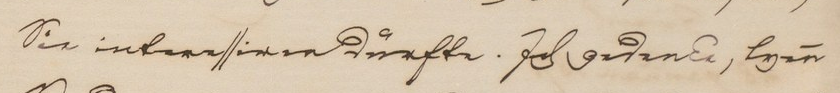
Sie interessiren dürfte. Ich gedenke, wenn
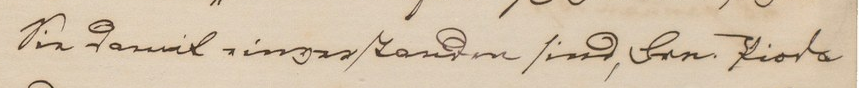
Sie damit einverstanden sind, Hrn. Pioda
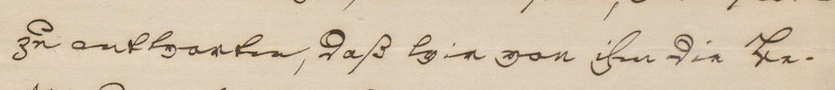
zu antworten, dass wir von ihm die Be-
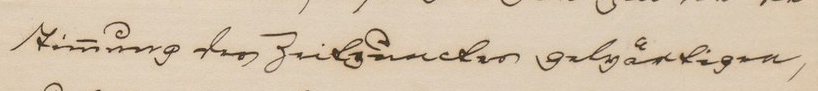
stimmung des Zeitpunctes gewärtigen,
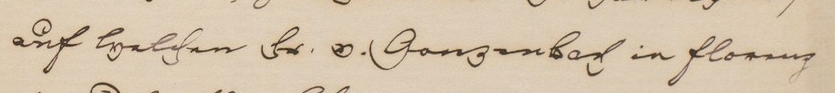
auf welchen Hr. v. Gonzenbach in Florenz
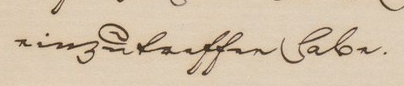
einzutreffen habe.
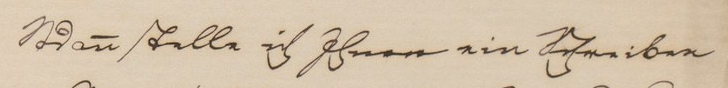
Sodann stelle ich Ihnen ein Schreiben
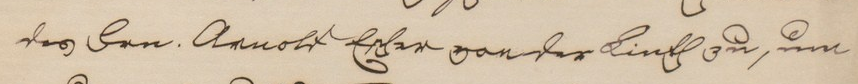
des Hrn. Arnold Escher von der Linth zu, um
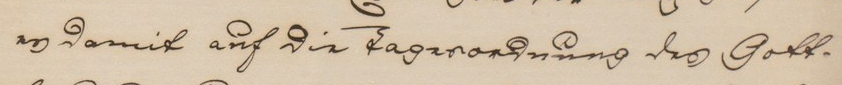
es damit auch auf die Tagesordnung des Gott-
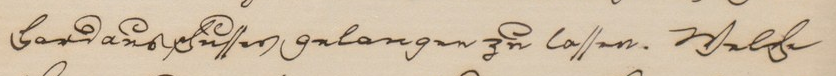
hardausschusses gelangen zu lassen. Welche
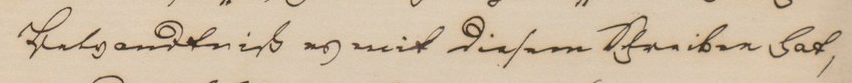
Bewandtniß es mit diesem Schreiben hat,
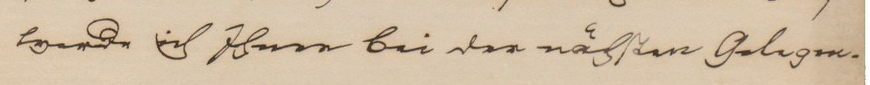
werde ich Ihnen bei der nächsten Gelegen-
